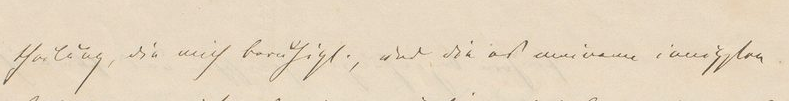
theilung, die mich beruhigt, und die es meinem innigsten
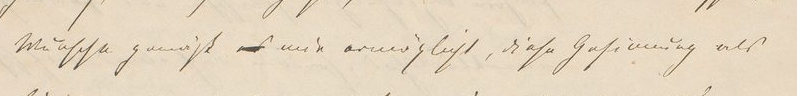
Wunsche gemäß es mir ermöglicht, diese Gesinnung als
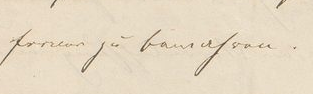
ferner zu bewahren.
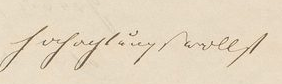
Hochachtungsvollst
